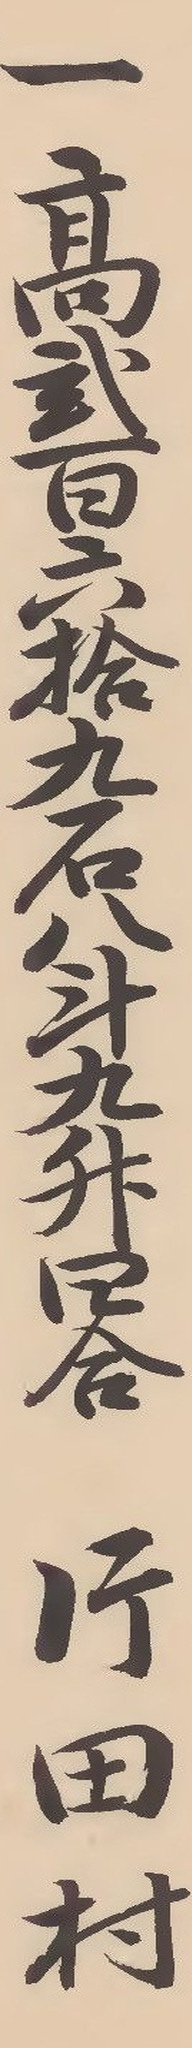一高弐百六拾九石八斗九升四合片田村
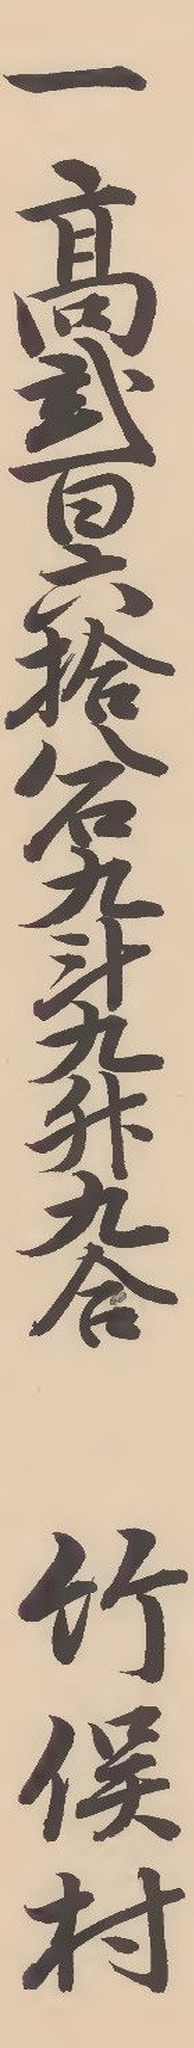一高弐百六拾八石九斗九升九合竹俣村

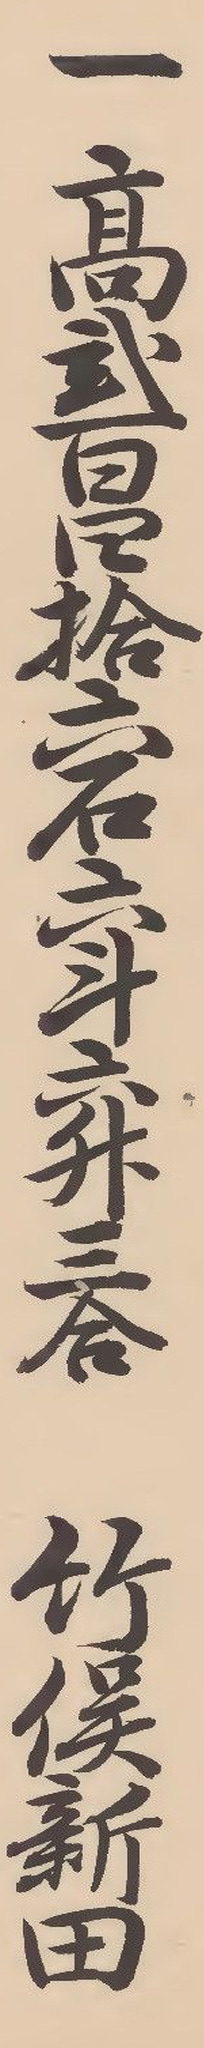一高弐百四拾六石六斗六升三合竹俣新田
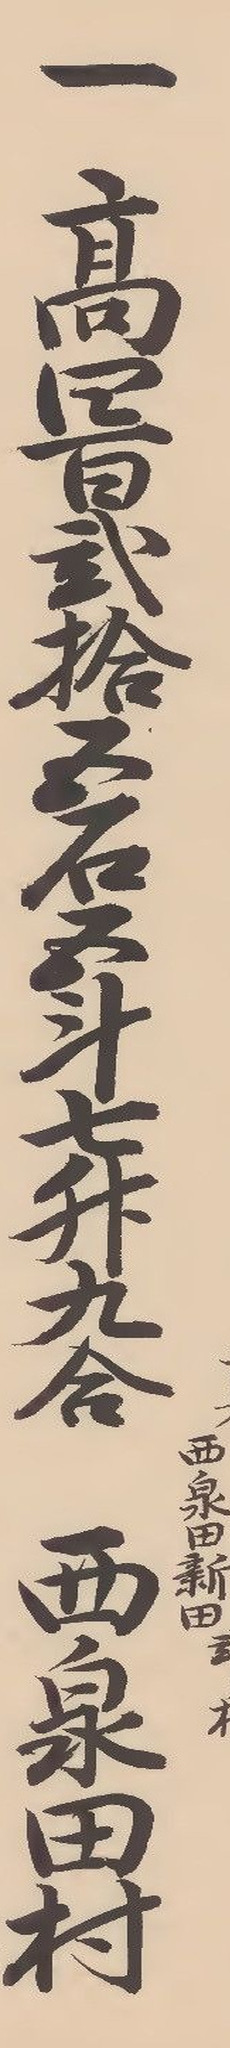一高四百弐拾五石五斗七升九合西泉田村
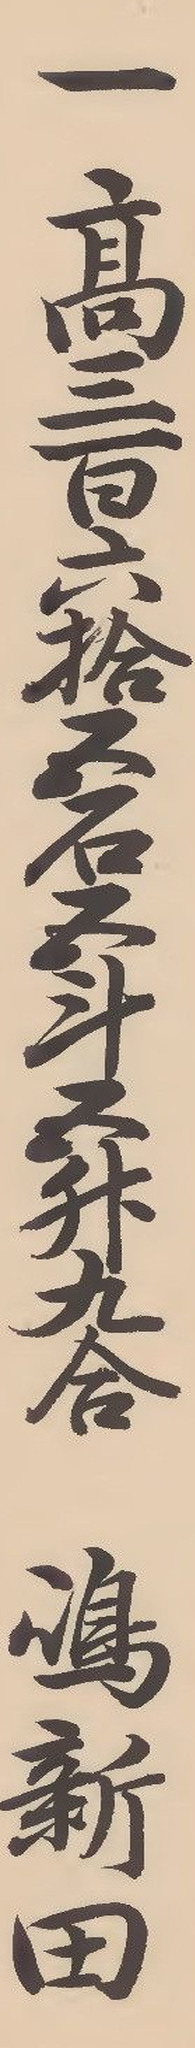一高三百六拾五石五斗五升九合島新田
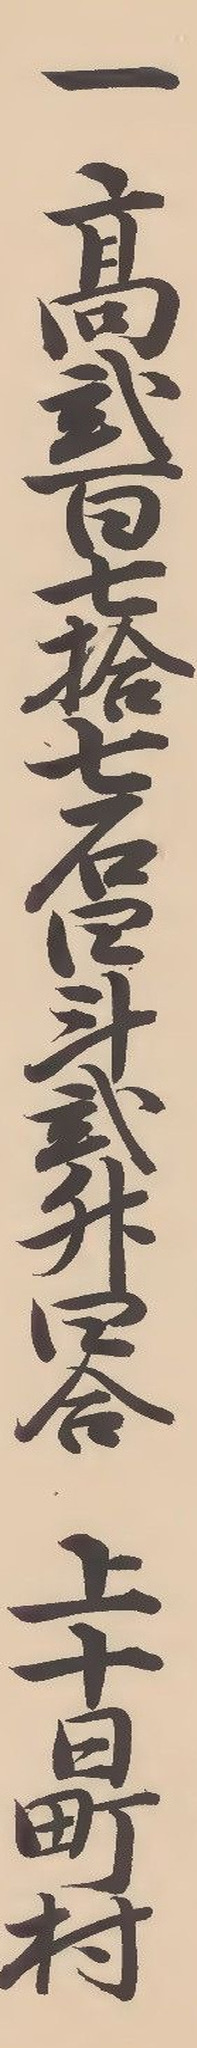一高弐百七拾七石四斗弐升四合上十日町村
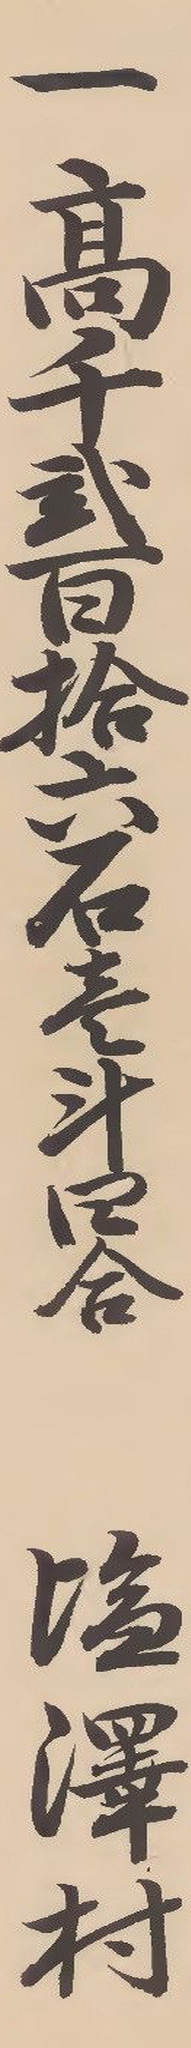一高千弐百拾六石壱斗四合塩沢村
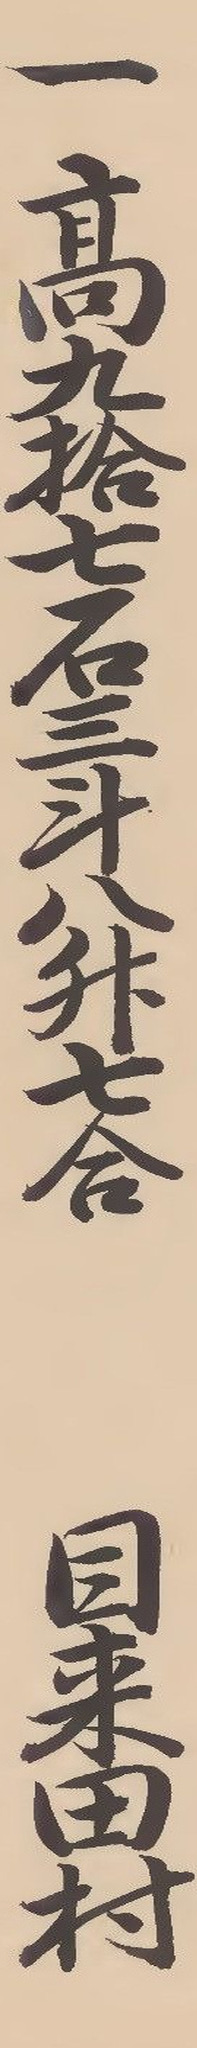一高九拾七石三斗八升七合目来田村
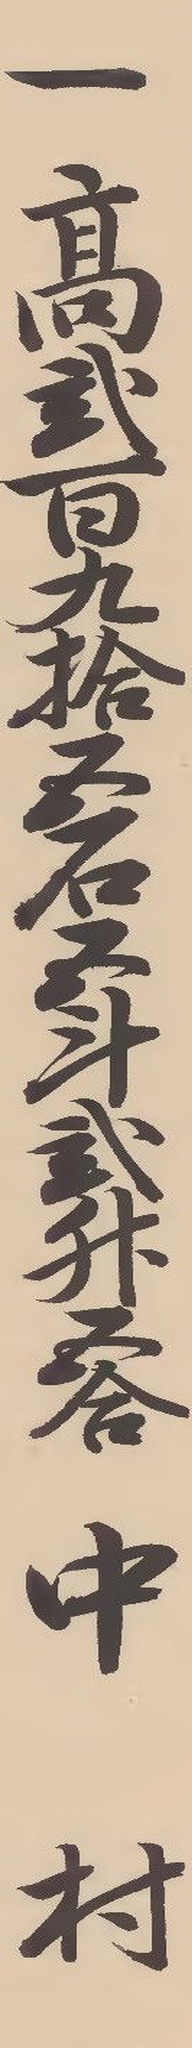一高弐百九拾五石五斗弐升五合中村
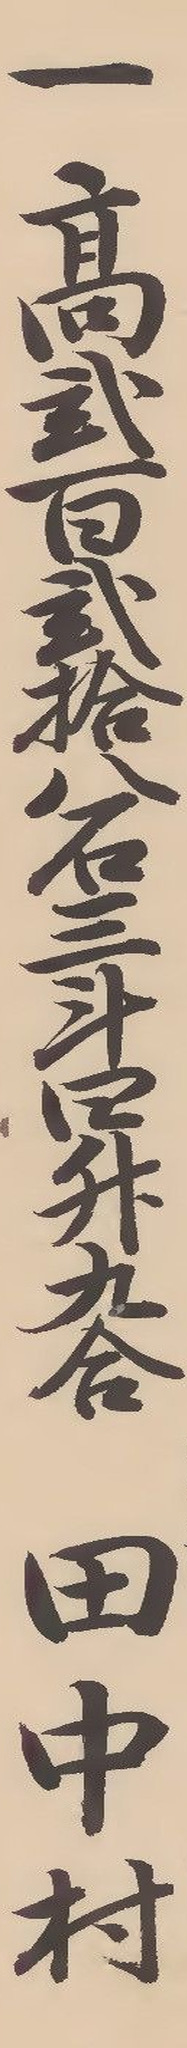一高弐百弐拾八石三斗四升九合田中村

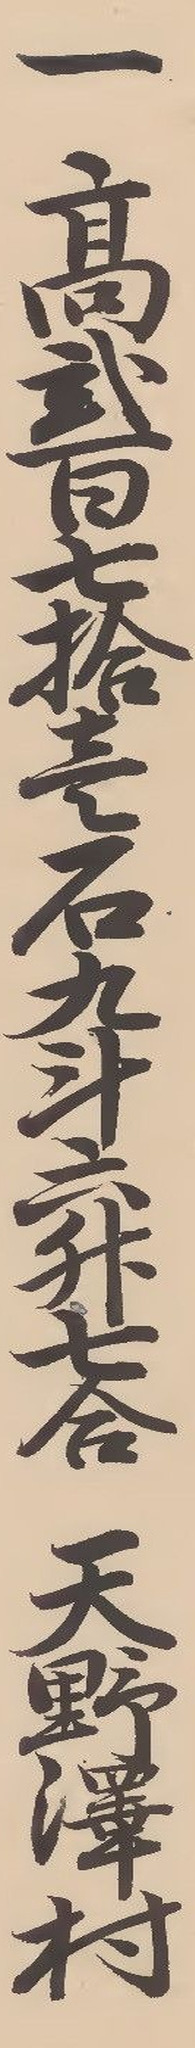一高弐百七拾壱石九斗六升七合天野沢村
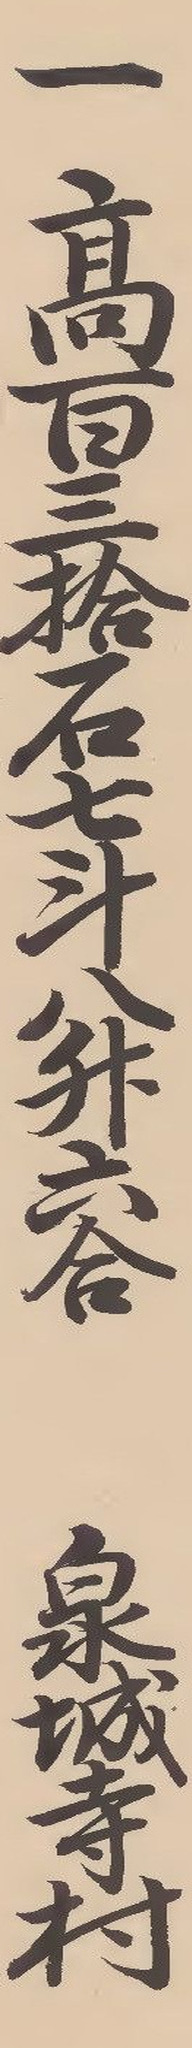一高百三拾石七斗八升六合泉城寺村
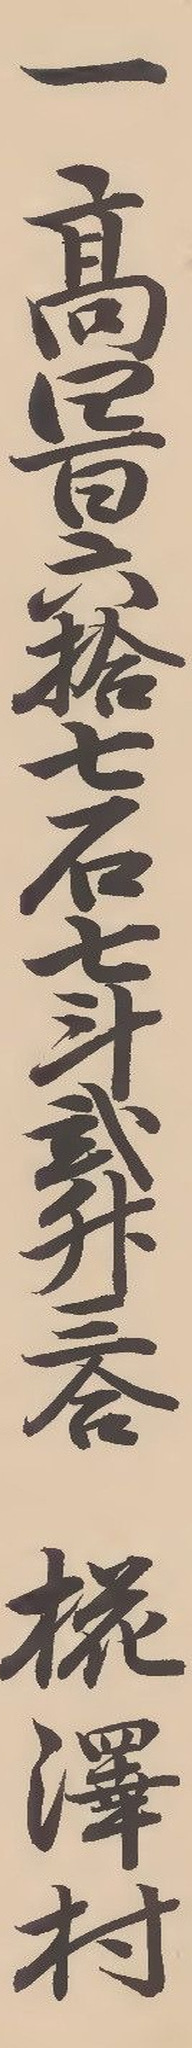一高四百六拾七石七斗弐升三合椛沢村
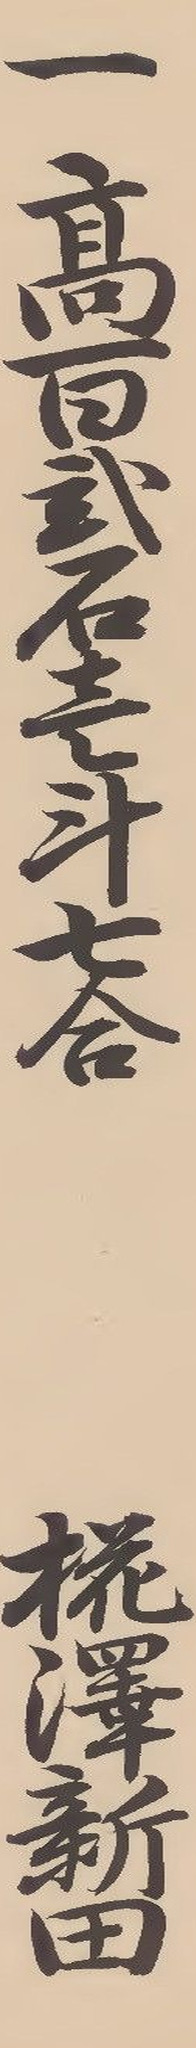一高百弐石壱斗七合椛沢新田
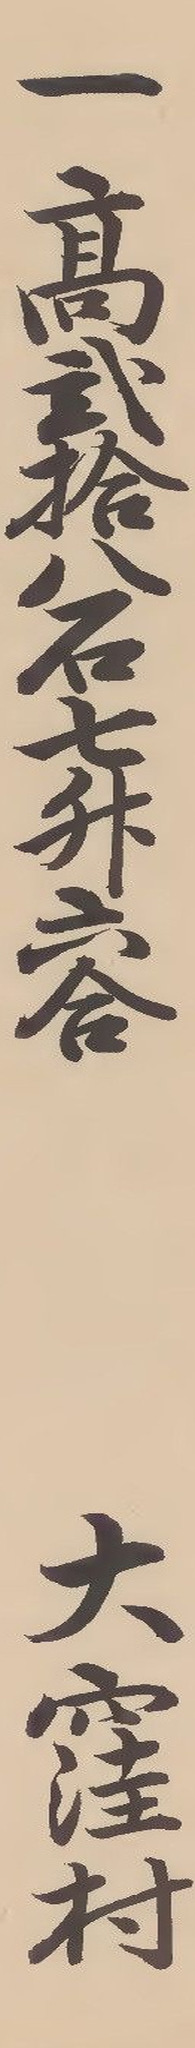一高弐拾八石七升六合大窪村
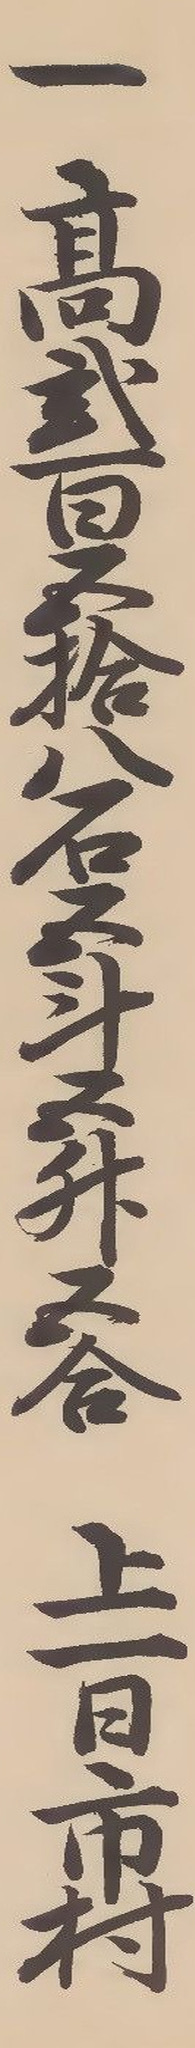一高弐百五拾八石五斗五升五合上一日市村
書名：越後国郷帳　中
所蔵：国立公文書館 National Archives of Japan
